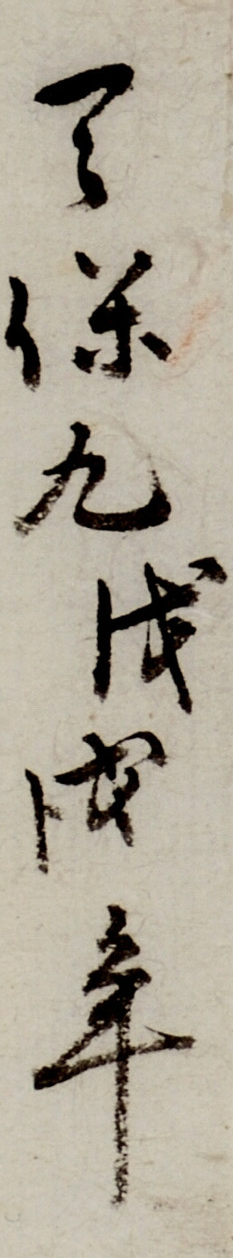天保九戊戌年
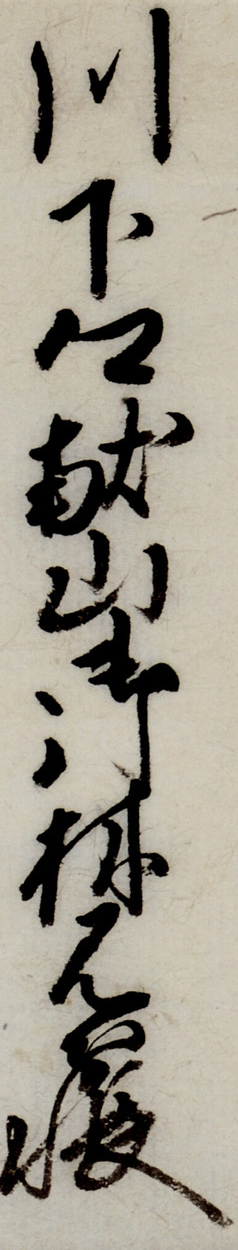川下郷献山御林見分帳
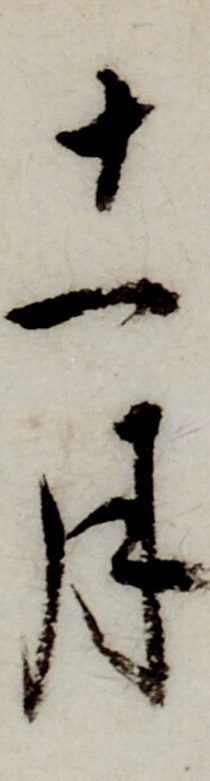十一月
